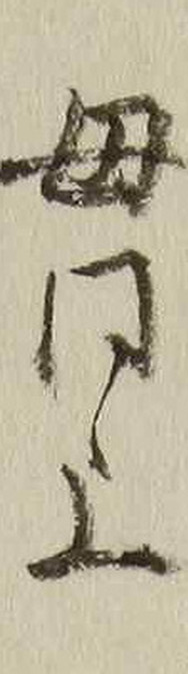母同上
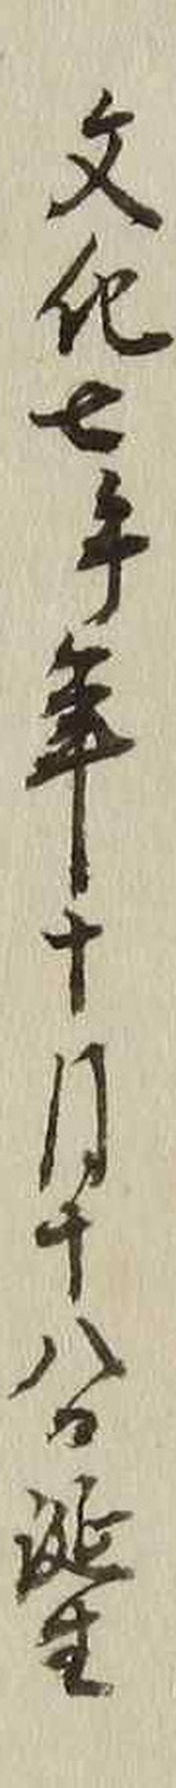文化七午年十月十八日誕聖生
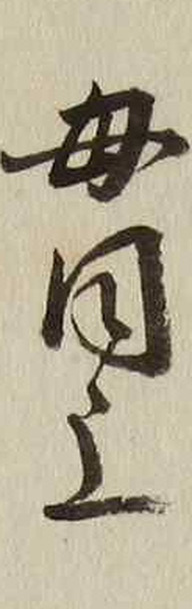母同上
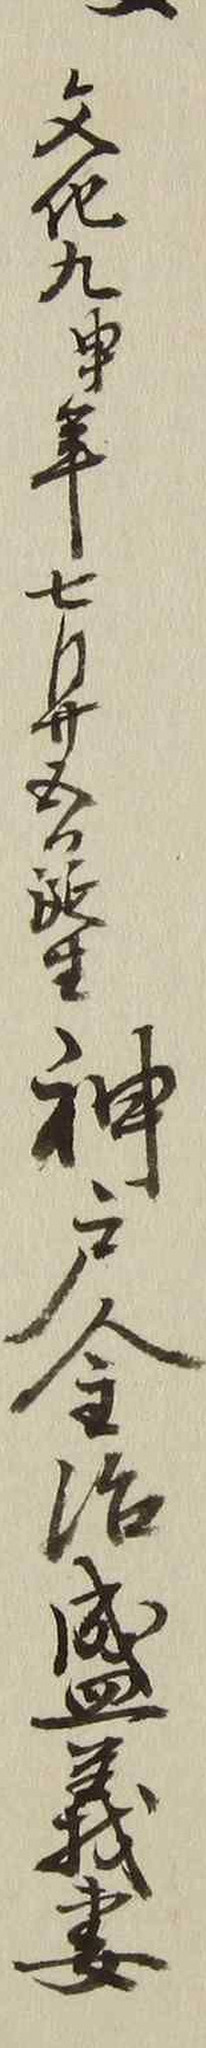文化九申年七月廿五日誕生神戸金治盛義妻
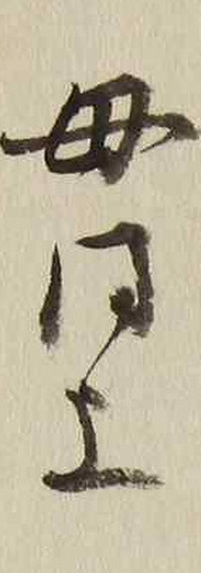母同上
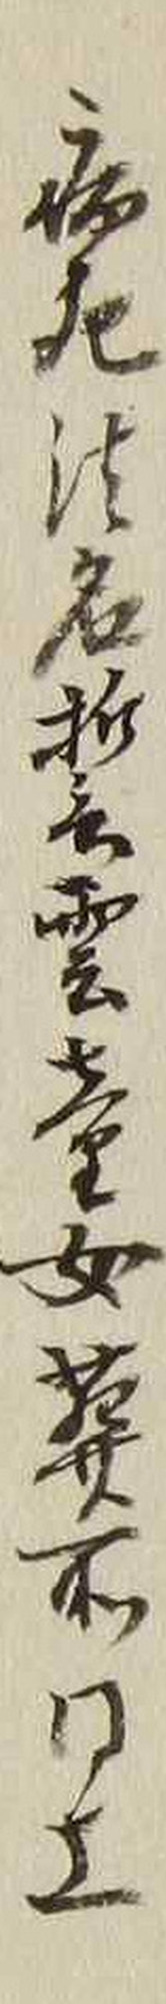病死法名誓雲童女葬所同上
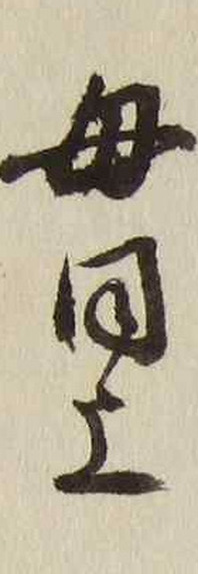母同上

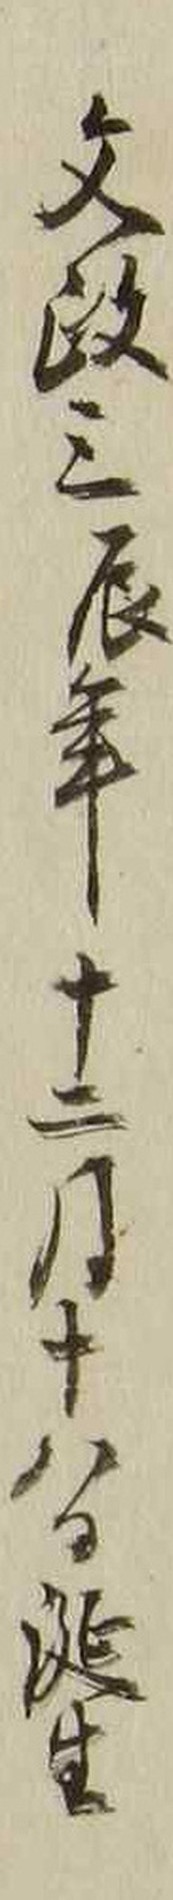文政三辰年十二月十八日誕生
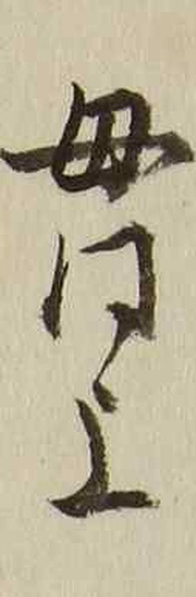母同上
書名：諸士系譜　巻之23　い之部23
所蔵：会津若松市立会津図書館
